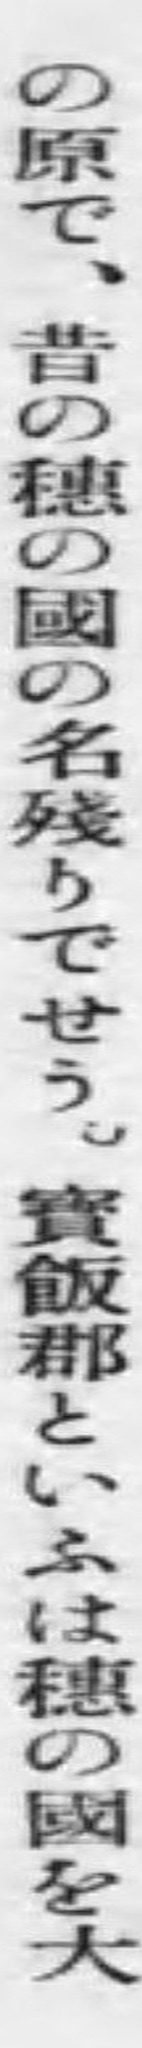の原で、昔の穂の国の名残りでせう。宝飯郡といふは穂の国を大
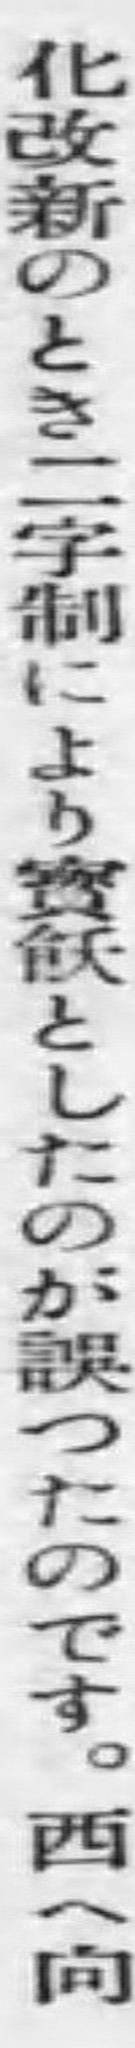化改新のとき二字制により宝飫としたのが誤つたのです。西へ向
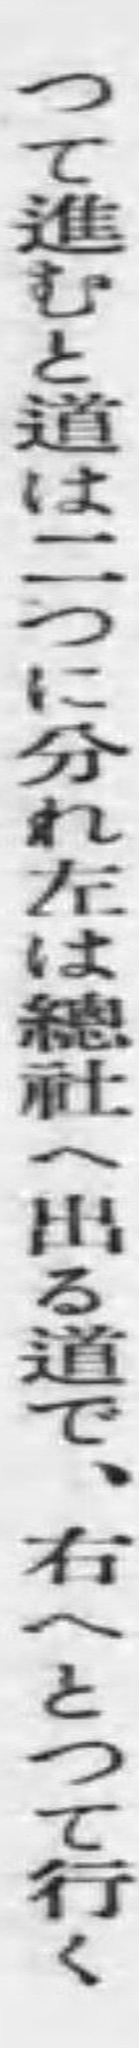つて進むと道は二つに分れ左は総社へ出る道で、右へとつて行く
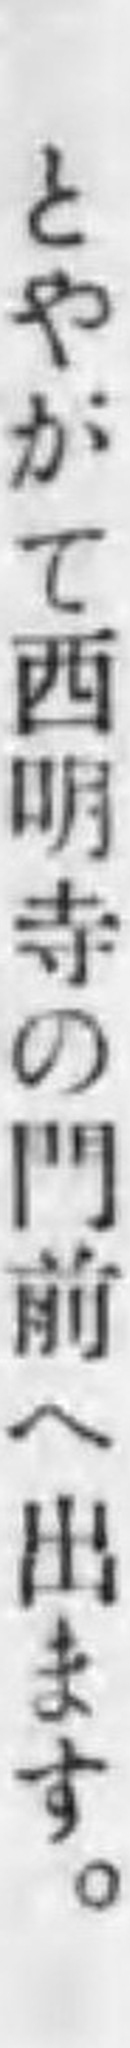とやがて西明寺の門前へ出ます。
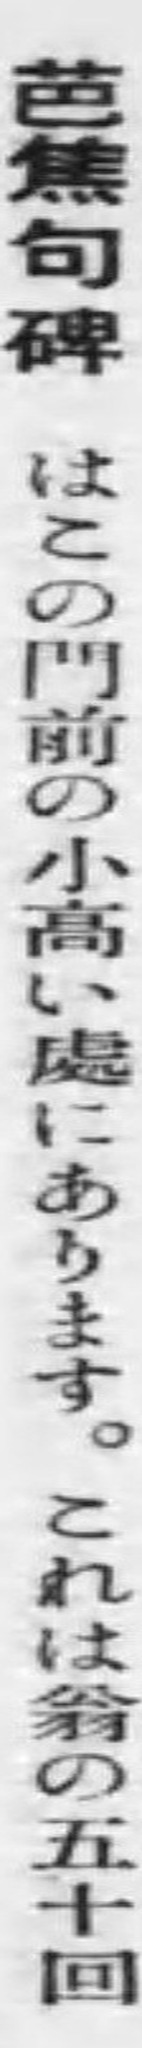芭蕉句碑はこの門前の小高い処にあります。これは翁の五十回
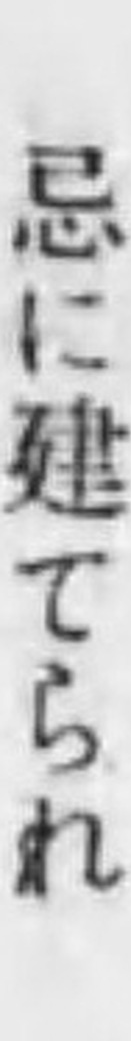忌に建てられ
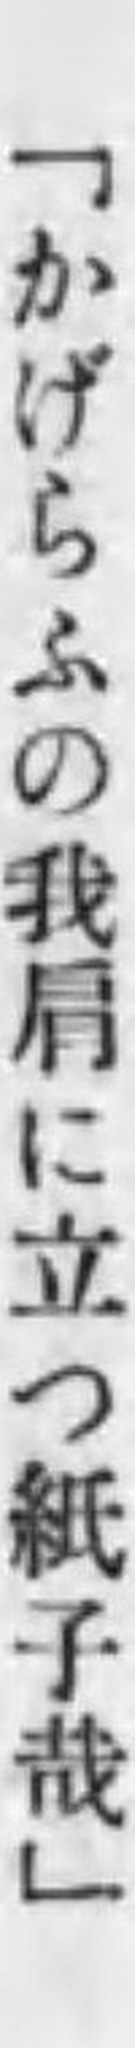「かげらふの我肩に立つ紙子哉」
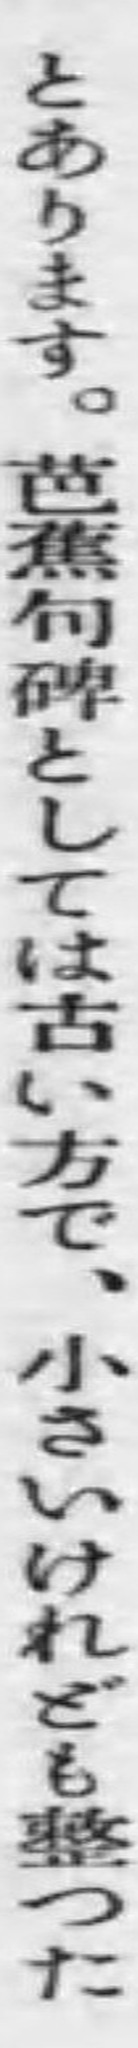とあります。芭蕉句碑としては古い方で、小さいけれども整つた
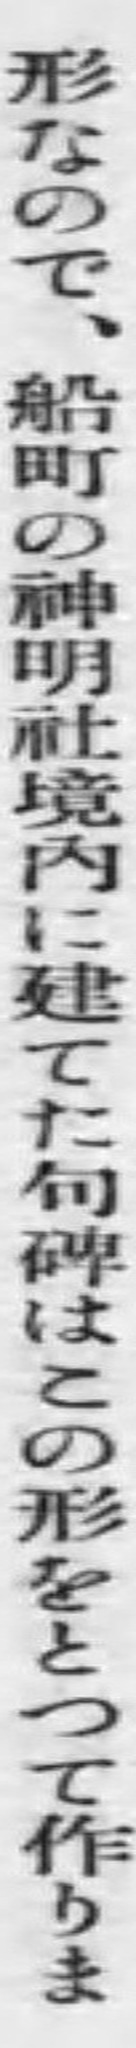形なので、船町の神明社境内に建てた句碑はこの形をとつて作りま
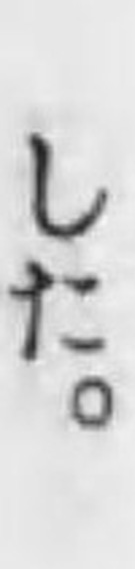した。
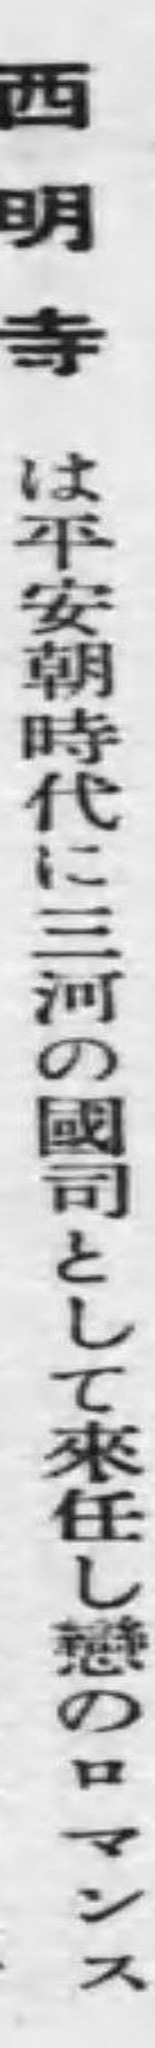西明寺は平安朝時代に三河の国司として来任し恋のロマンス
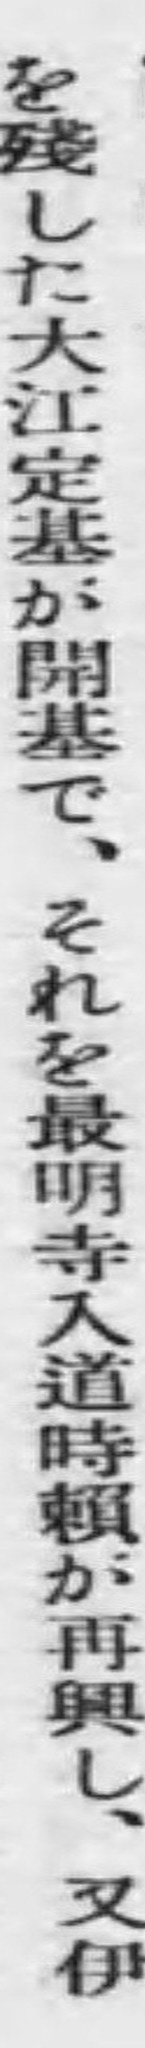を残した大江定基が開基で、それを最明寺入道時頼が再興し、又伊
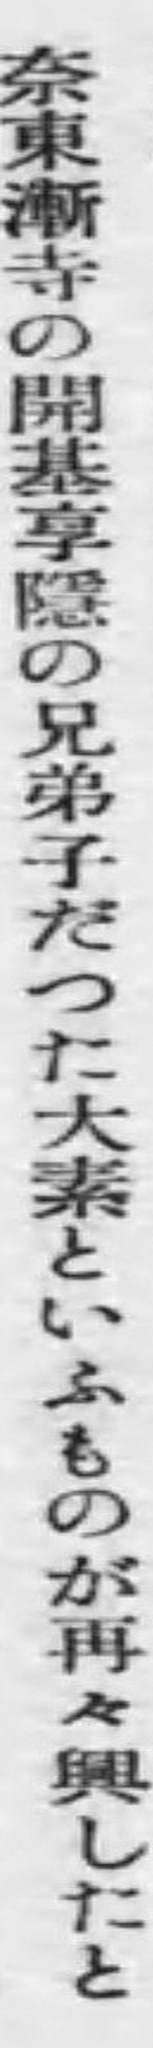奈東漸寺の開基享隠の兄弟子だつた大素といふものが再々興したと
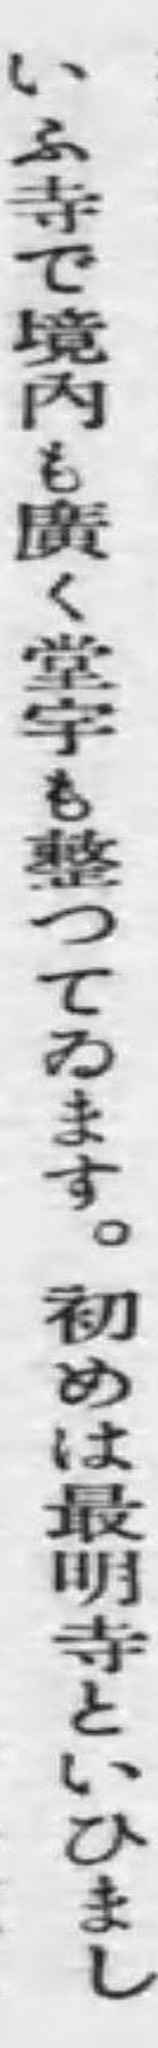いふ寺で境内も広く堂宇も整つてゐます。初めは最明寺といひまし
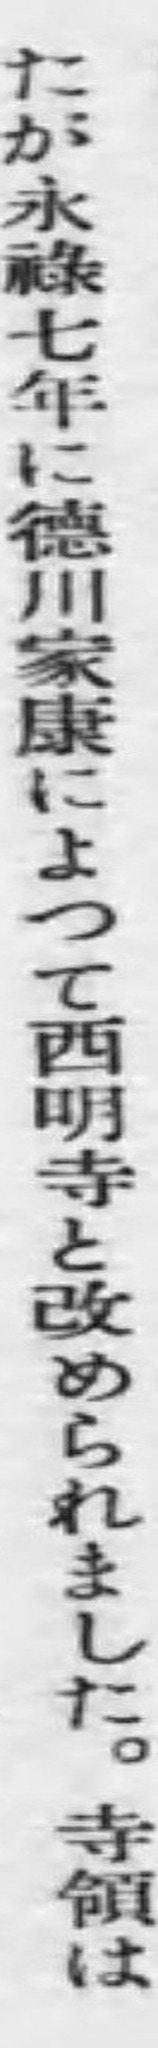たが永禄七年に徳川家康によつて西明寺と改められました。寺領は
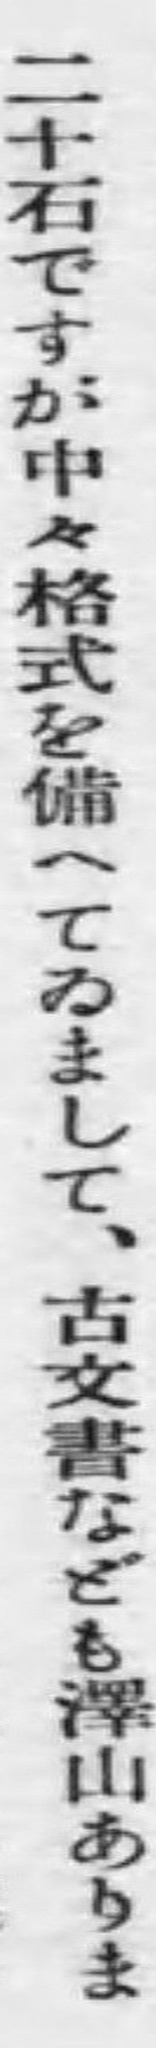二十石ですが中々格式を備へてゐまして、古文書なども沢山ありま
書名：東三河道中記 : 豊橋市及其附近案内
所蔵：国立国会図書館 National Diet Library, JAPAN
